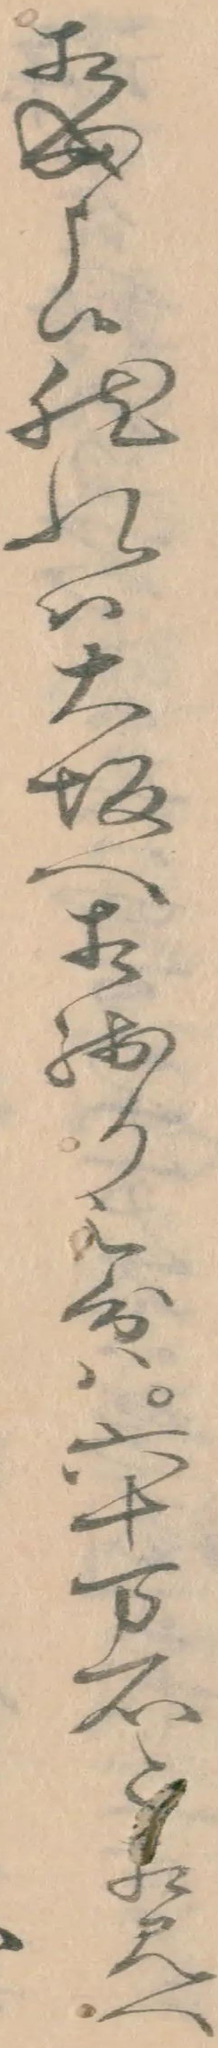相成申候然れは大坂へ相残り之分は。六十万石と相見へ
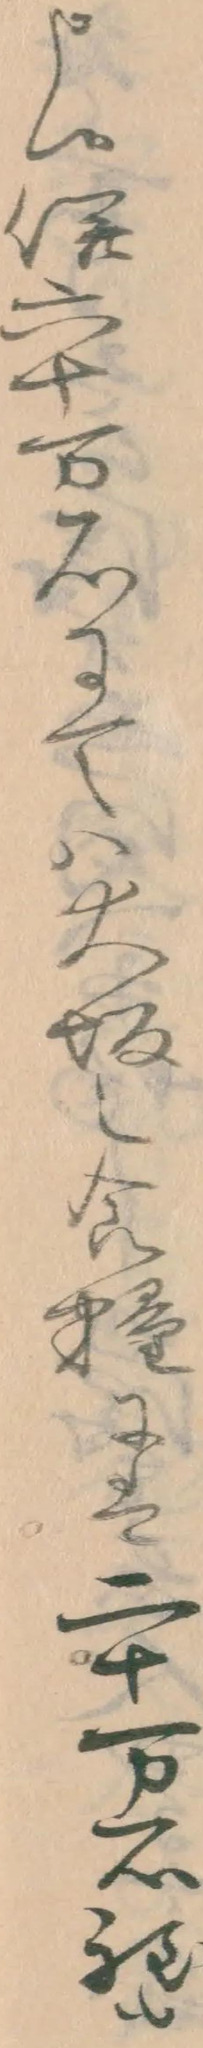申候併六十万石にては大坂之食糧には二十万石程も
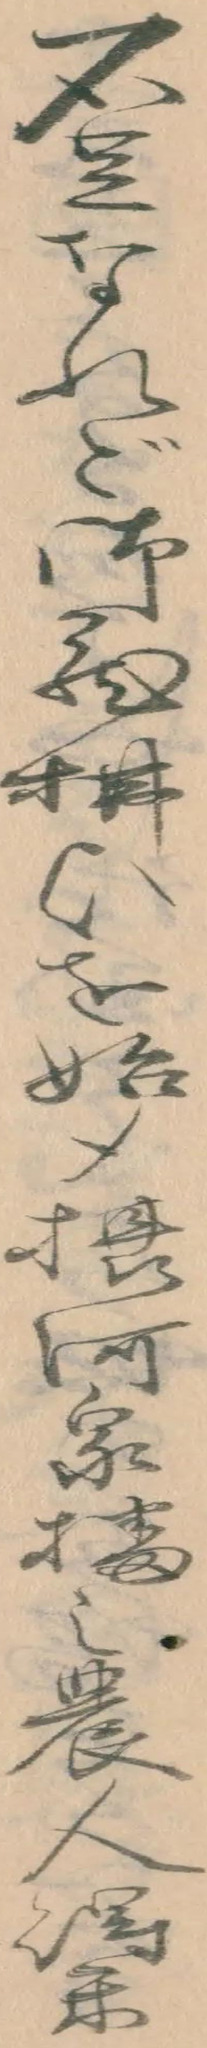不足なれど御蔵払ひを始め摂河泉播之農人得米
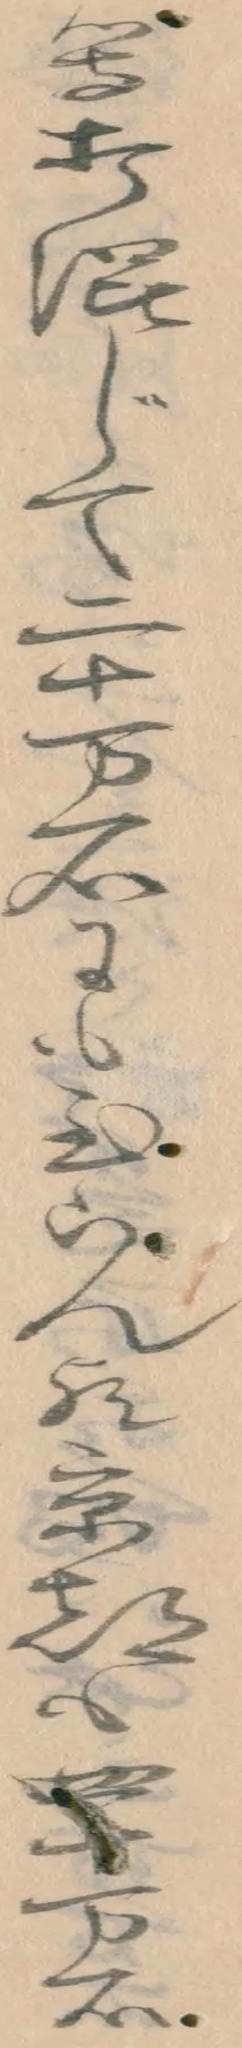等打混じて二十万石にも至らん歟京都も四十万石
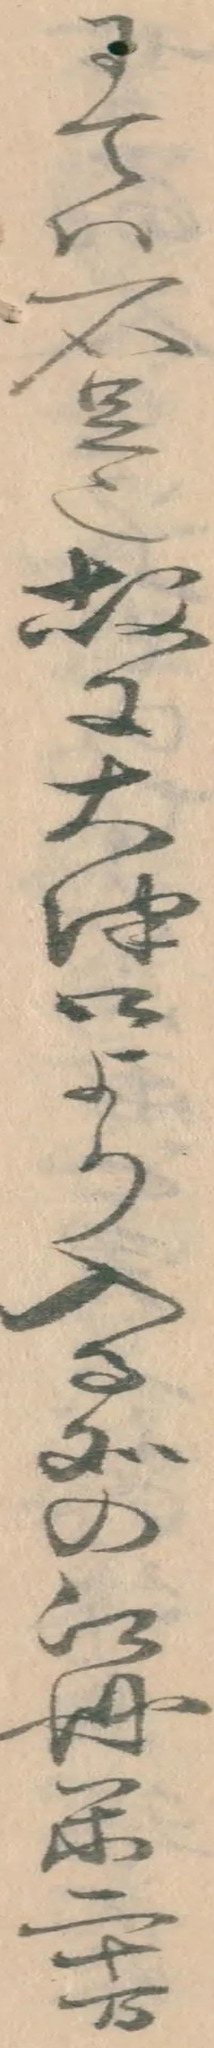にては不足也故に大津口より入る処の江州米二十万
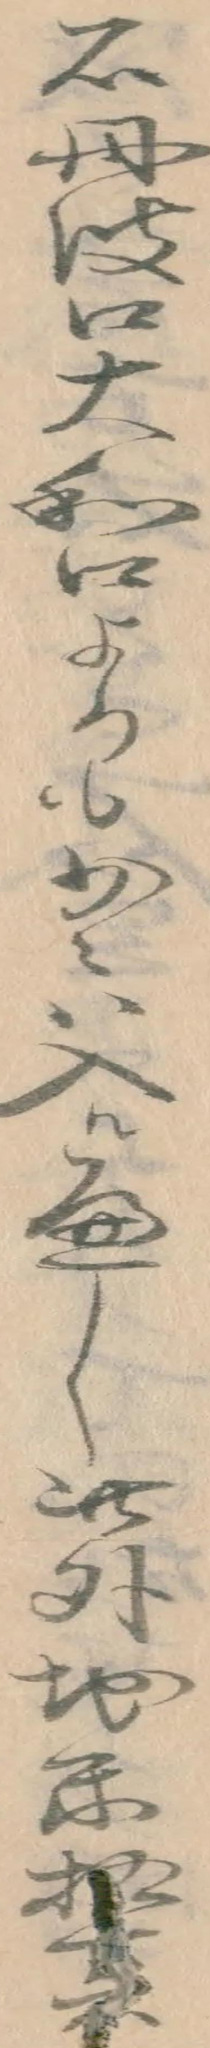石丹波口大和口よりも少々は入るへし此外地米拾万石
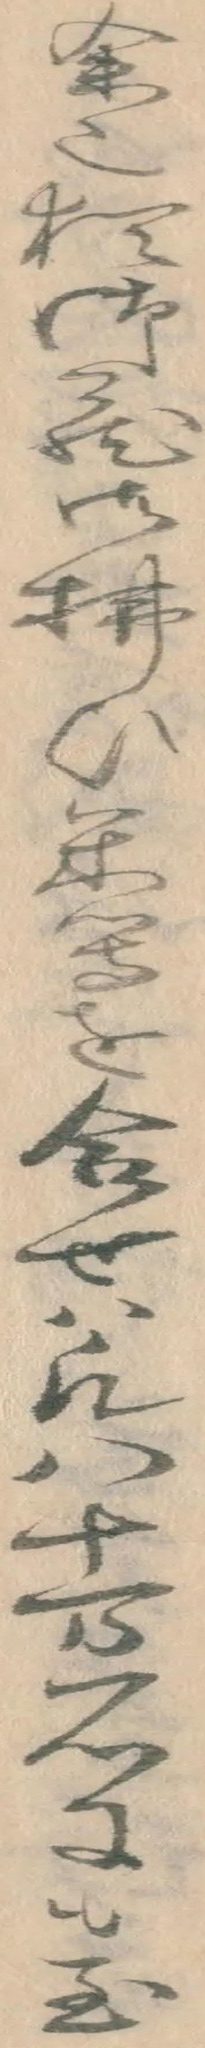余也猶御蔵御払ひ米等を合せは凡八十万石にも至
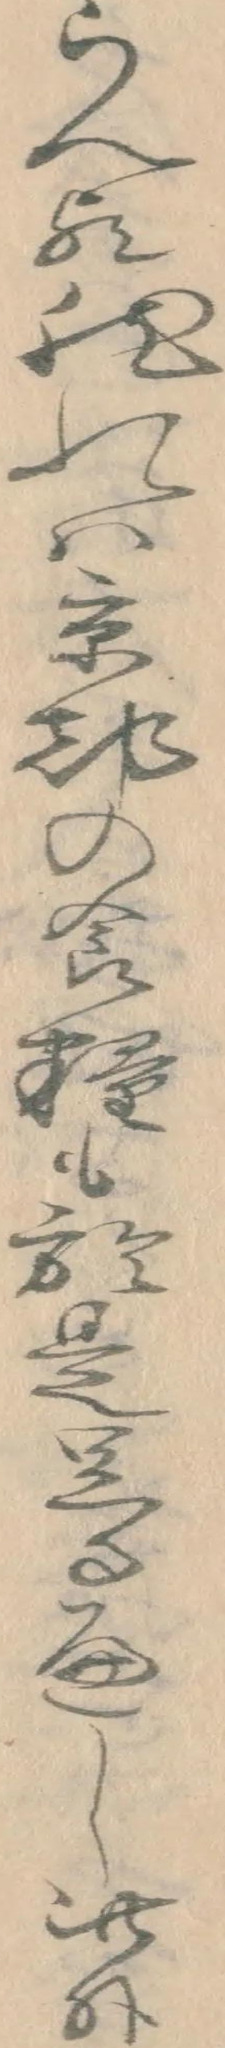らん歟然れは京都の食糧も於是足るへし此外
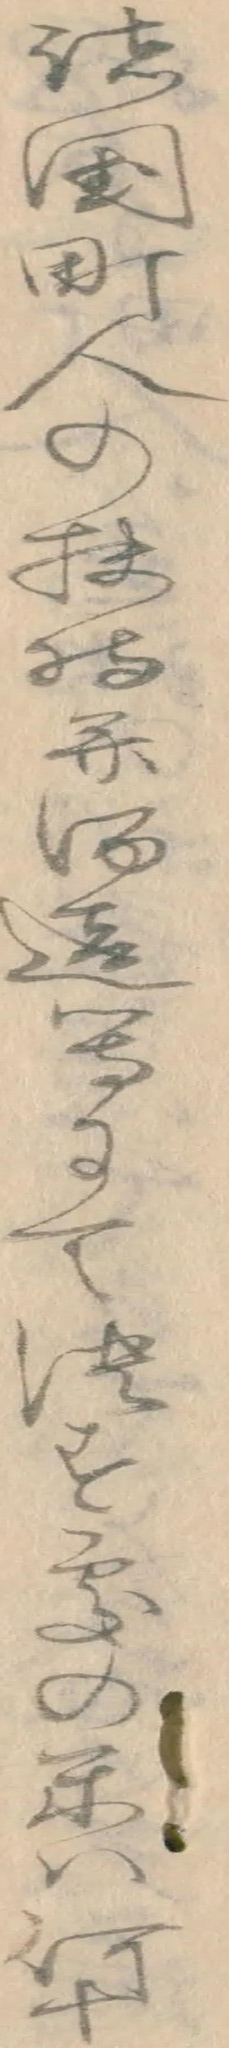諸国町人の扶持并酒造等にて潰す処の米は何十
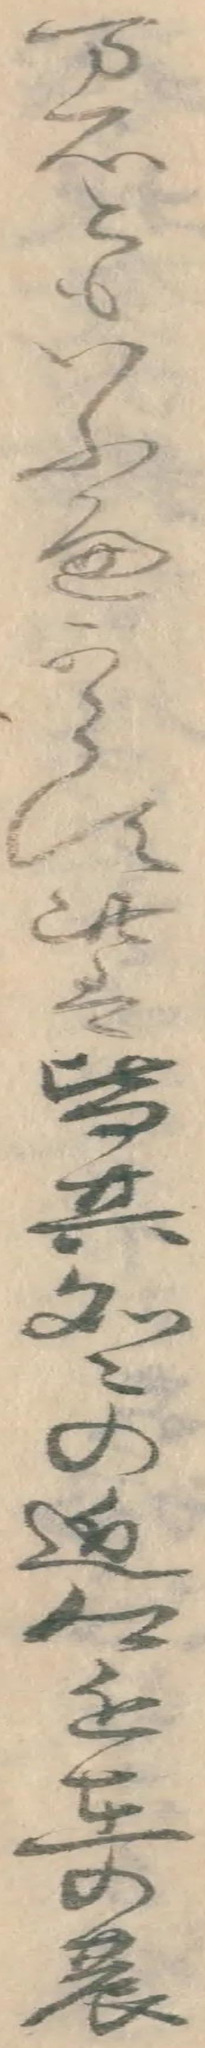万石ともいふへからす此は皆其処々の近郷近在の農
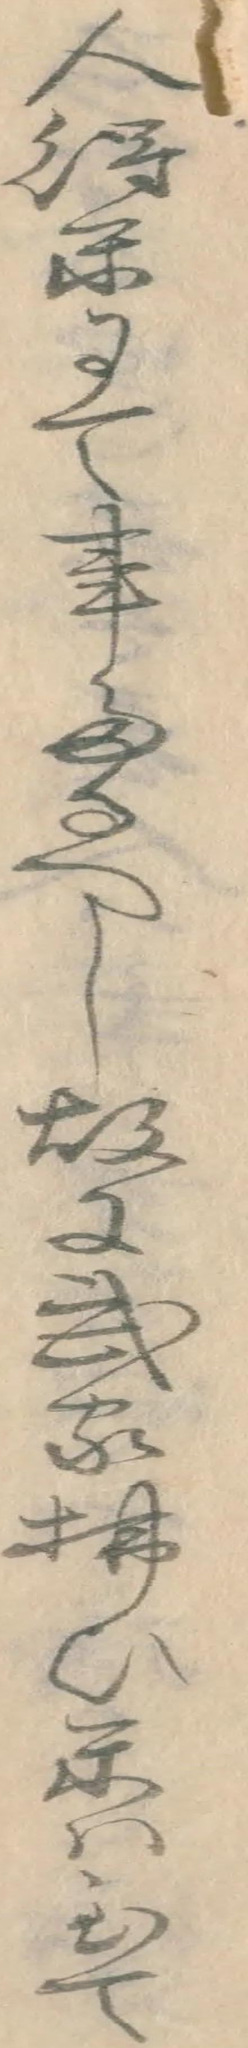人得米にて事たるへし故に武家払ひ米は至て
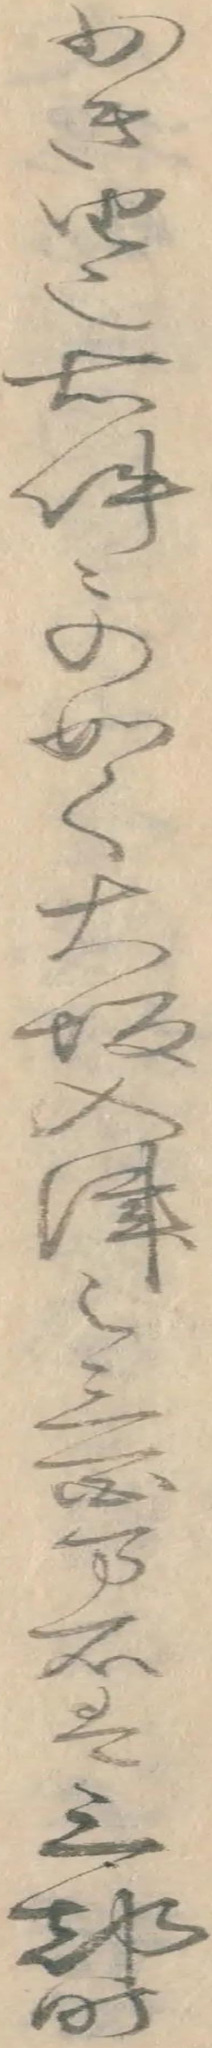少き由也右件々の如く大坂入津之三百万石は三都町

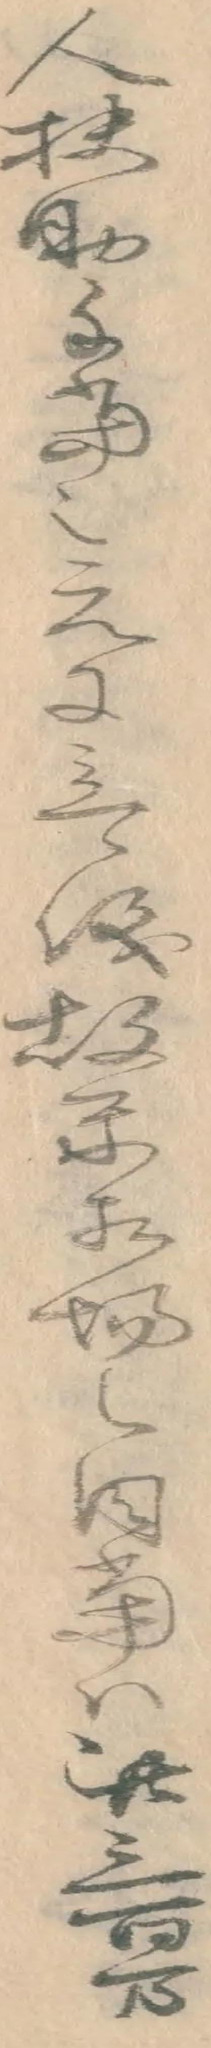人扶助手当之元に立候儀故米相場之内当は此三百万
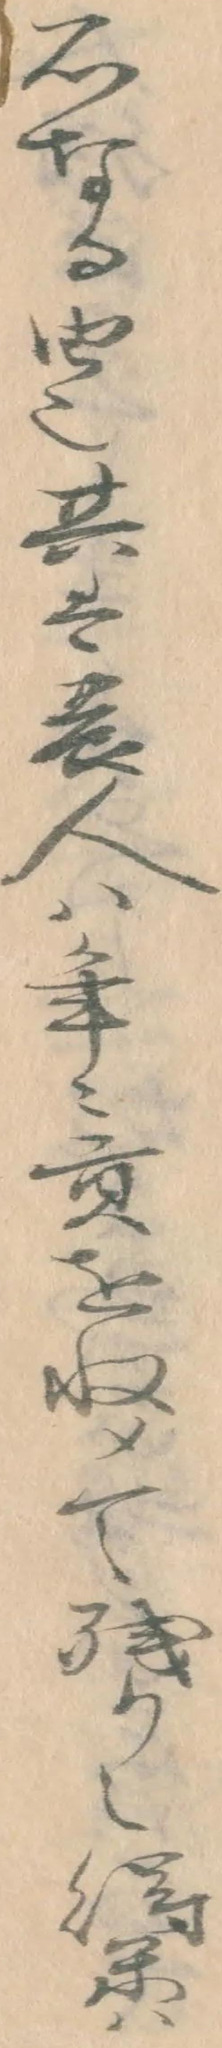石なる由也其は農人は年々貢を収めて残り之得米は
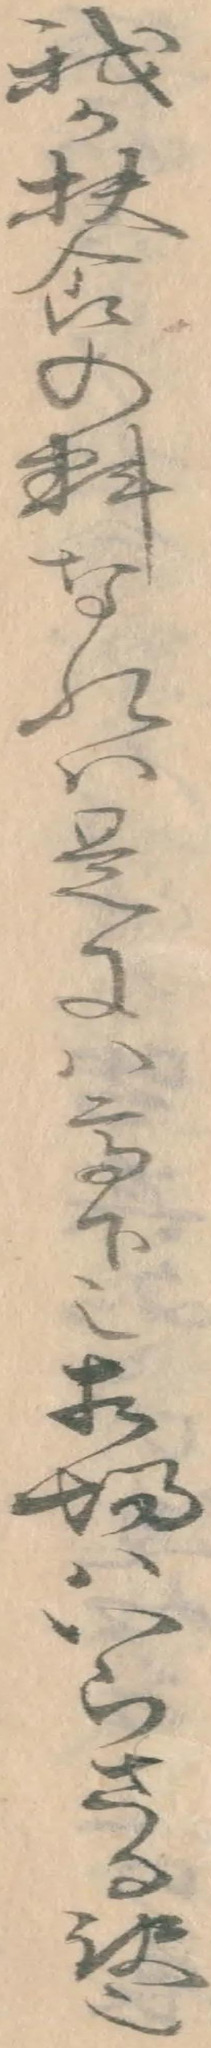我か扶食の料なれは是には高下之相場はいらさる訳也
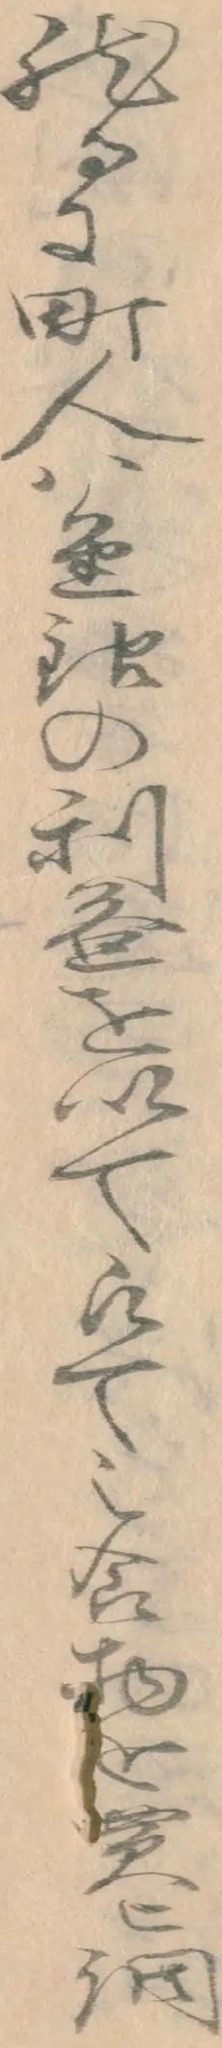然るに町人は金銀の利益を以て凡て之食物を買ひ調
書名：斎庭之穂
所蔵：国立国会図書館 National Diet Library, JAPAN
